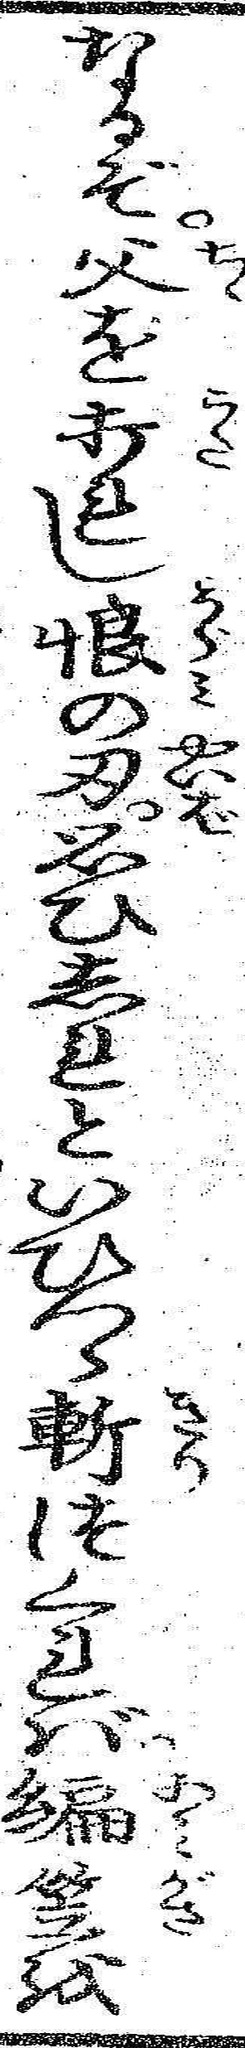なるぞ。父を打れし恨の刃。思ひしれといひつゝ斬つくれば。編笠を
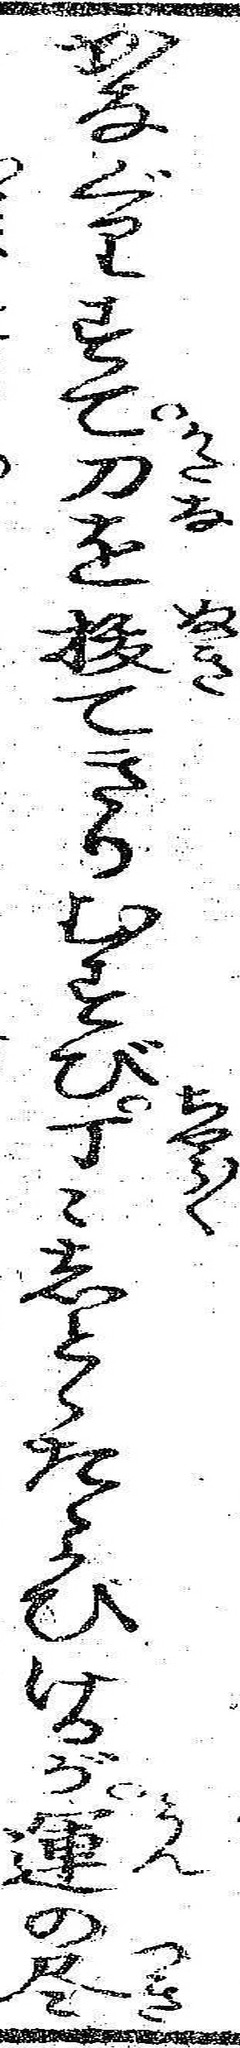かなぐりすて。刀を抜てきりむすび。丁々しとゝたゝかひけるが。運の尽
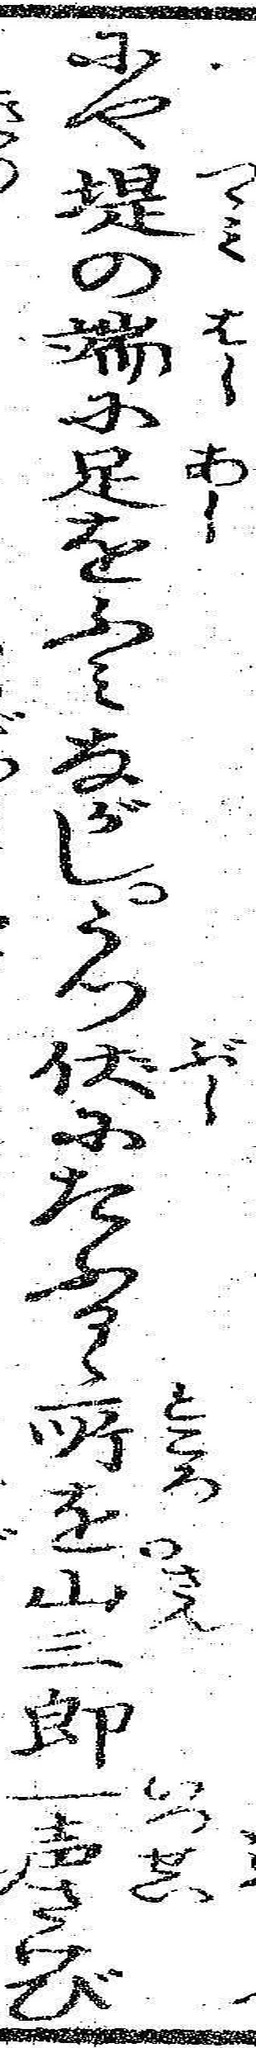にや堤の端に足をふみながし。うつ伏にたふるゝ所を。山三郎一声さけび
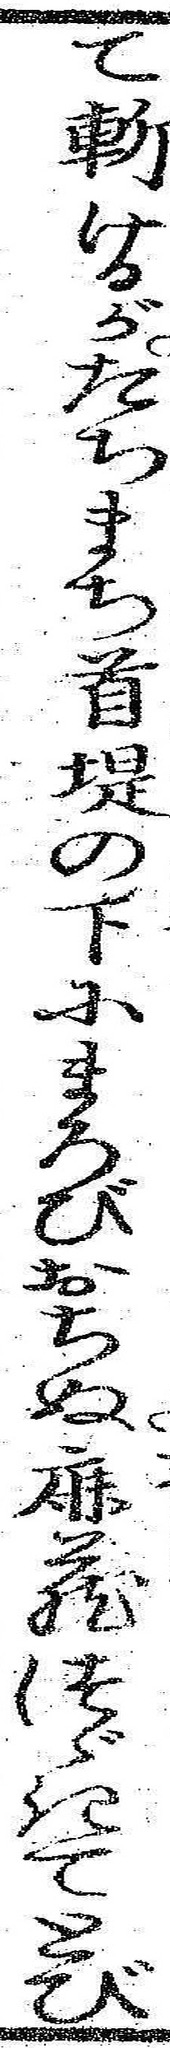て斬けるが。たちまち首堤の下にまろびおちぬ。鹿蔵つゞきてとび
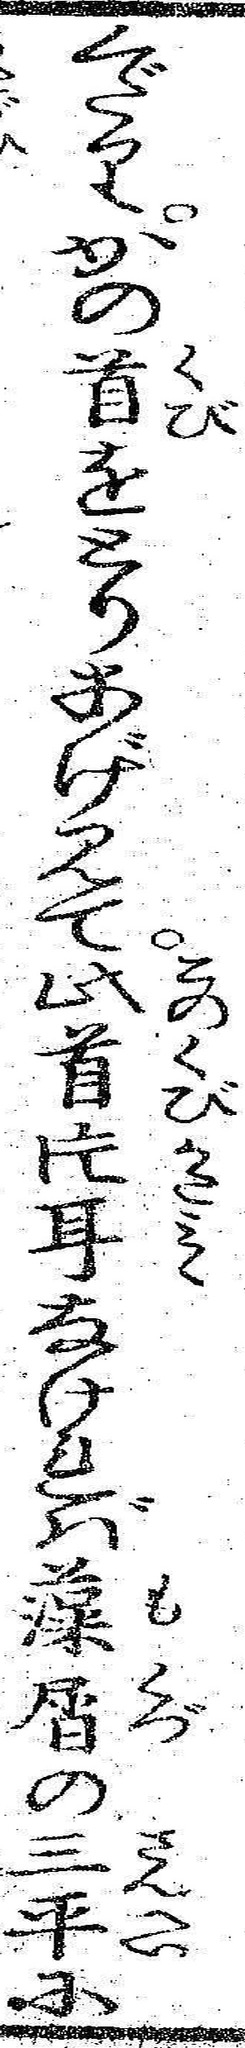くだり。かの首をとりあげ見て。此首片耳なければ藻屑の三平に
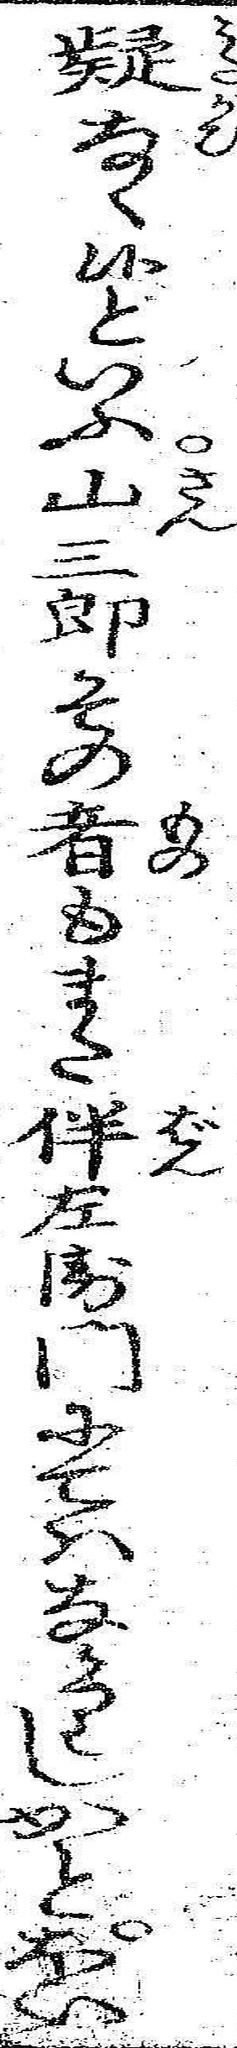疑なく候といふ。山三郎その者もまた伴左衛門にてはなかりしかと。ほい
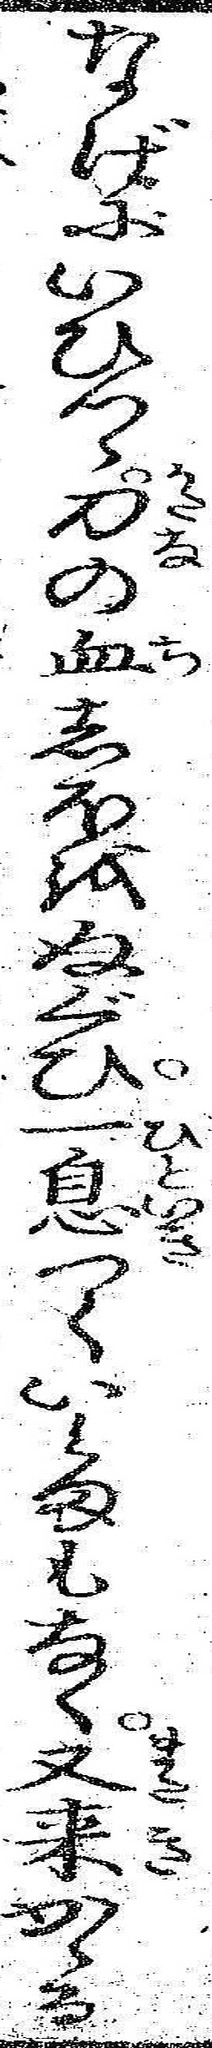なげにいひつゝ。刀の血しほをぬぐひ。一息つくいとまもなく。又来かゝる
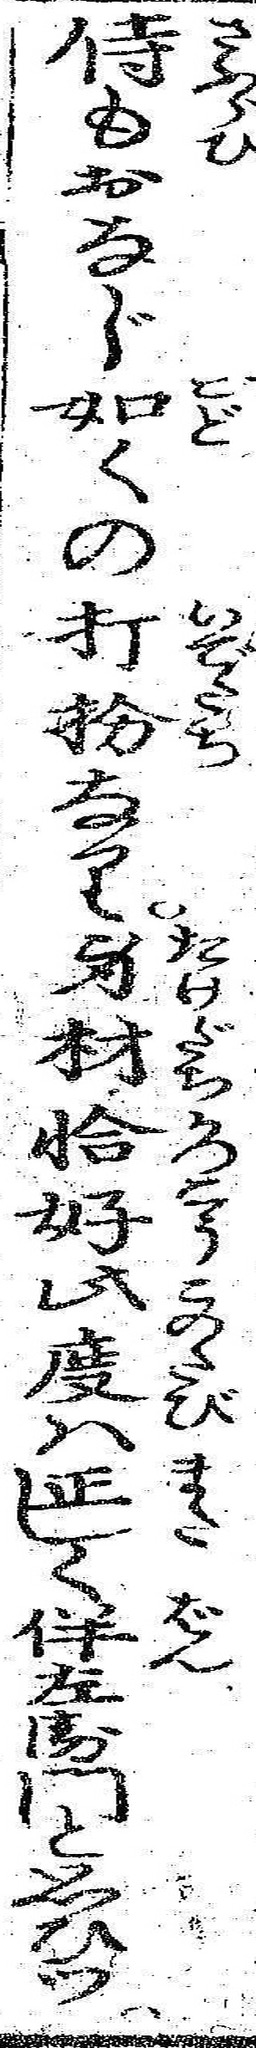侍もおなじ如くの打扮なり。身材恰好此度は正しく伴左衛門と思ひツ。

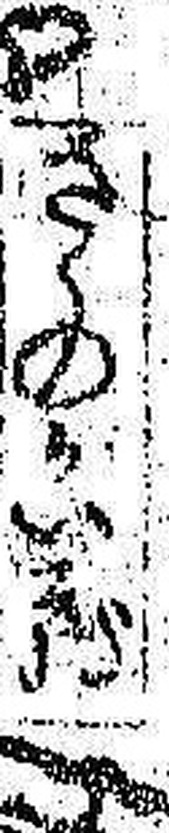さゝのがい蔵
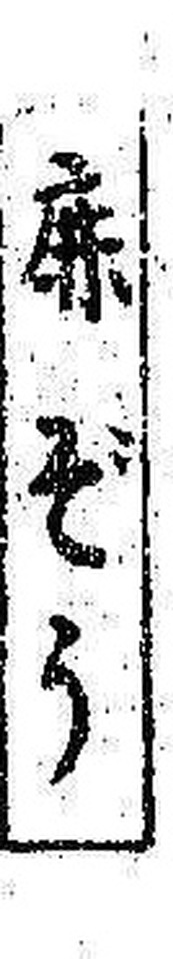鹿ぞう
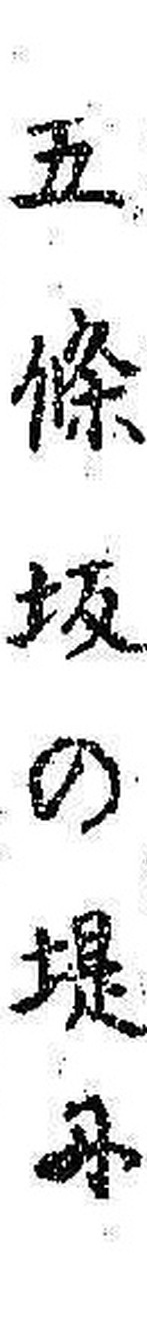五条坂の堤に
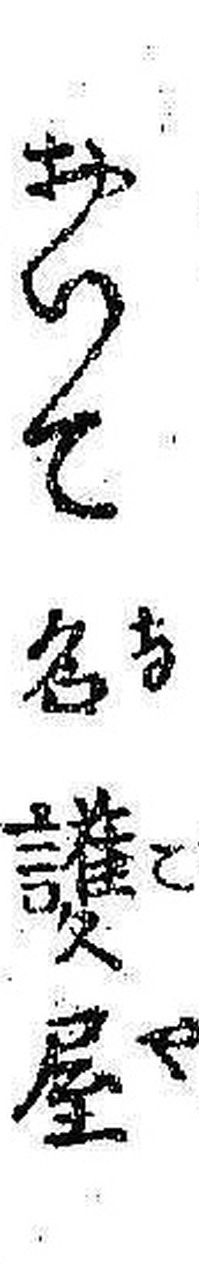おいて名護屋
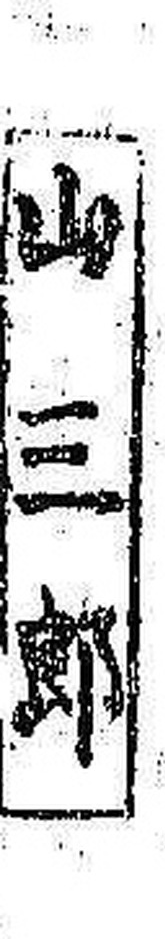山三郎
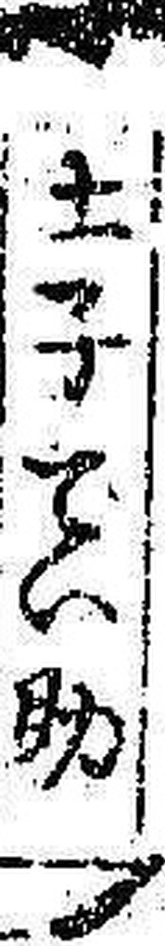土子でい助
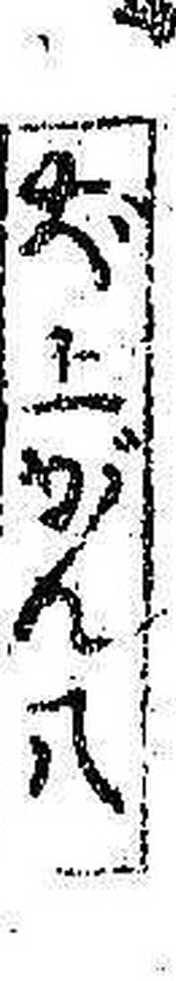犬上がん八

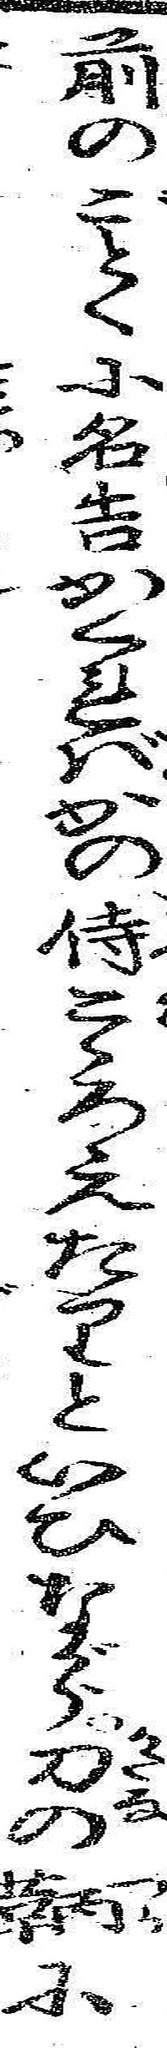前のごとくに名告かくれば。かの侍こゝろえたりといひながら。刀の鞆に
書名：昔話稲妻表紙
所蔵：国文学研究資料館
